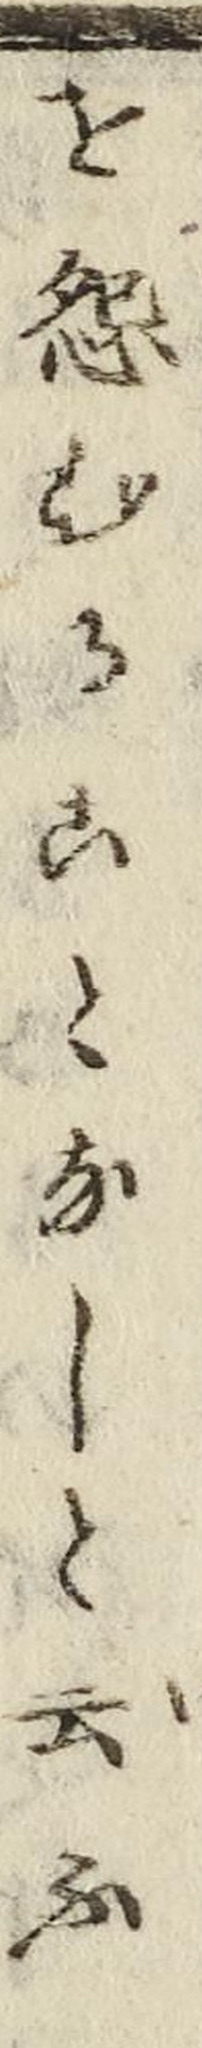を怨むることなしと云ふ
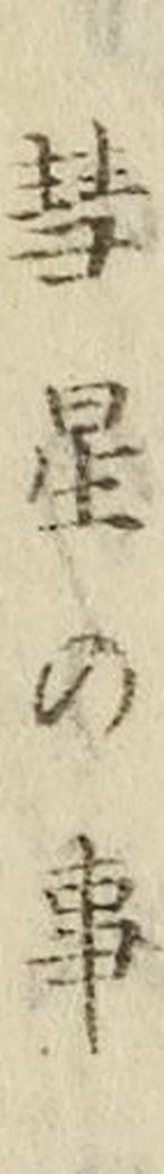彗星の事
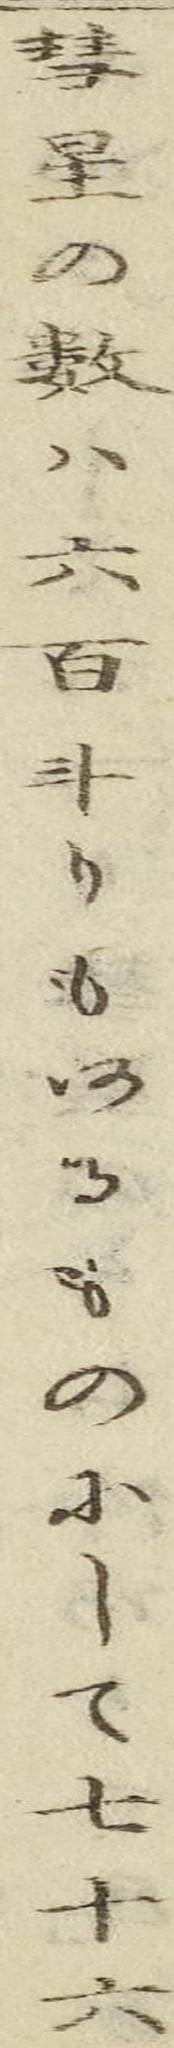彗星の数は六百斗りもあるものにして七十六
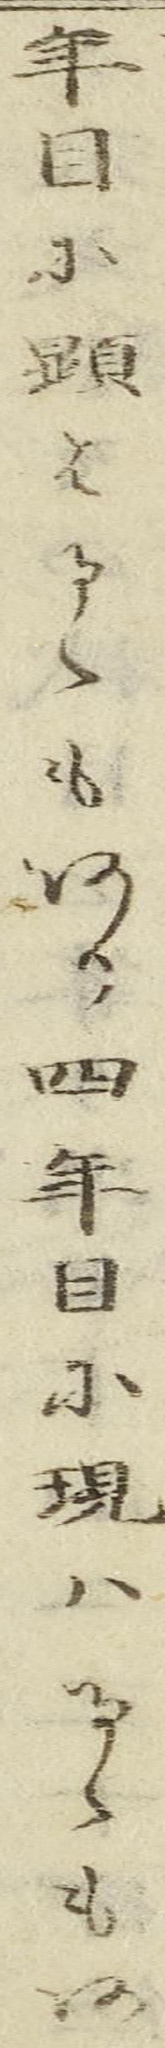年目に顕はるゝもあり四年目に現はるゝもあ
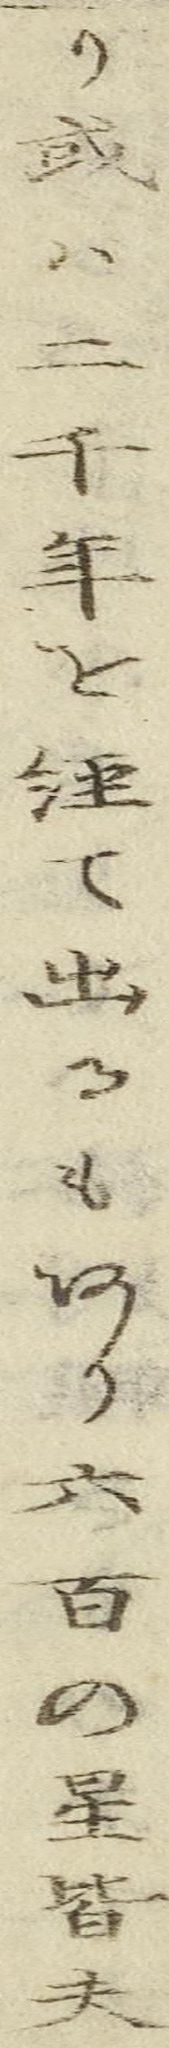り或は二千年を経て出るもあり六百の星皆夫
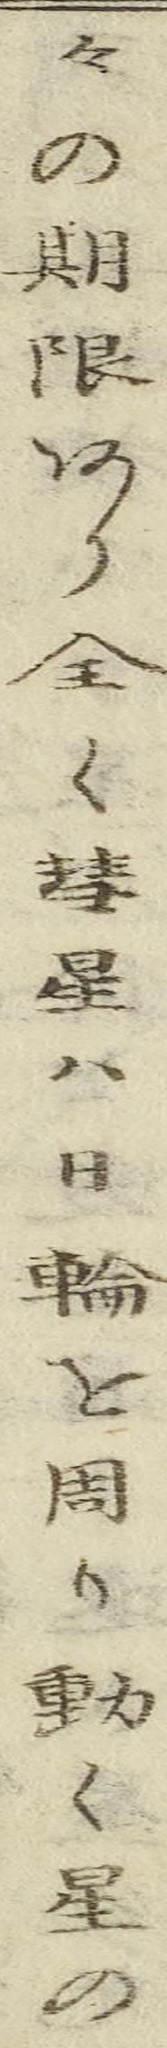々の期限あり全く彗星は日輪を周り動く星の
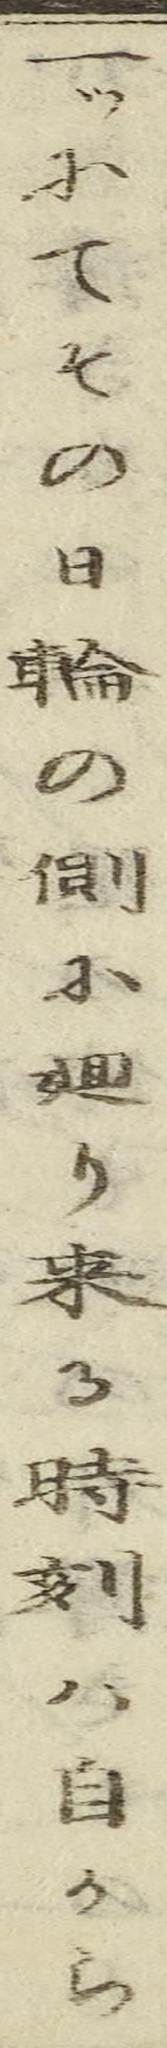一ツにてその日輪の側に廻り来る時刻は自から
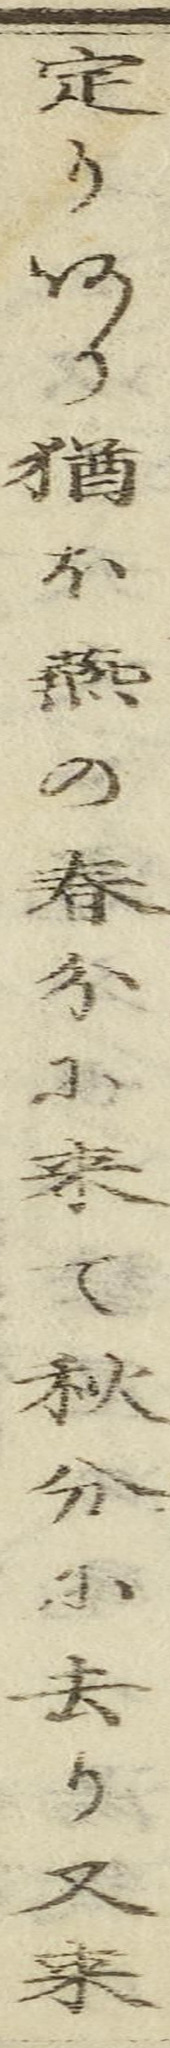定りあり猶ほ燕の春分に来て秋分に去り又来
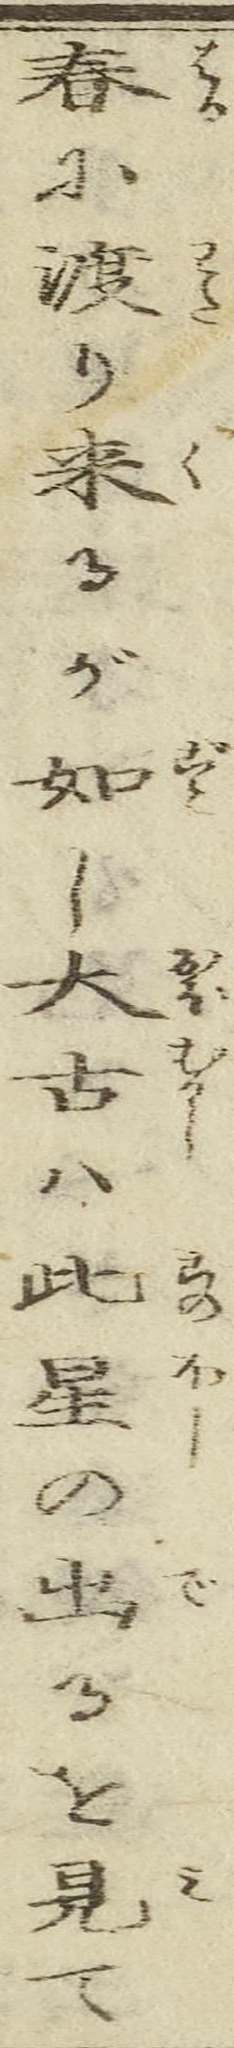春に渡り来るが如し大古は此星の出るを見て

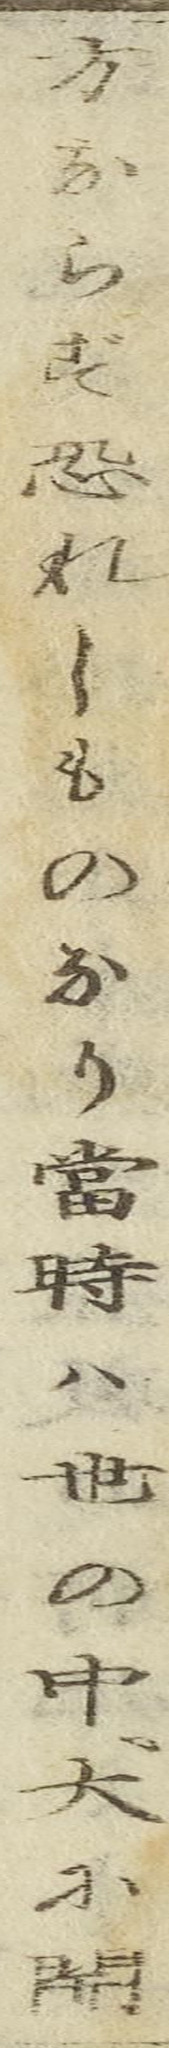方ならず恐れしものなり当時は世の中。大に開
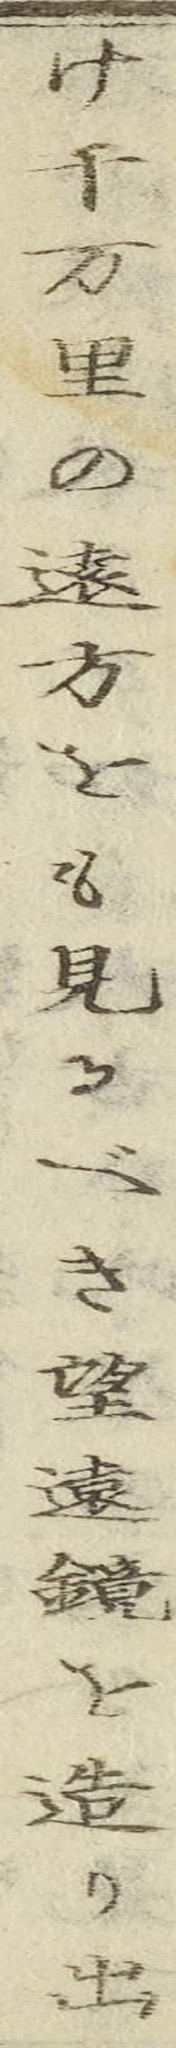け千万里の遠方をも見るべき望遠鏡を造り出
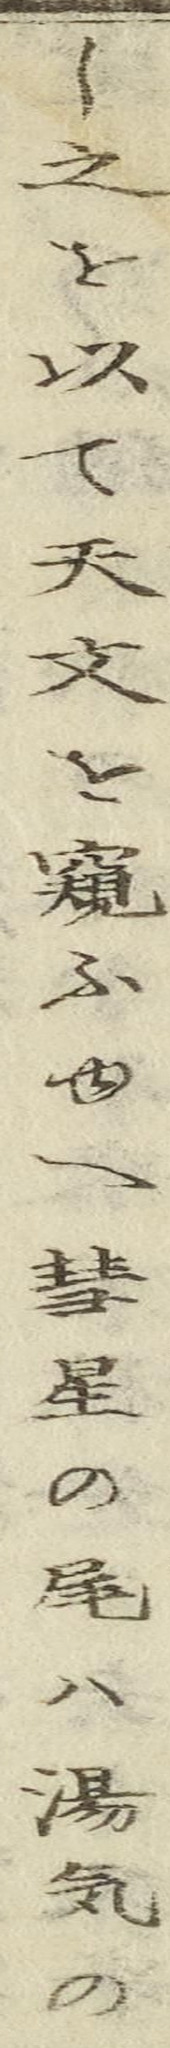し之を以て天文を窺ふゆへ彗星の尾は湯気の
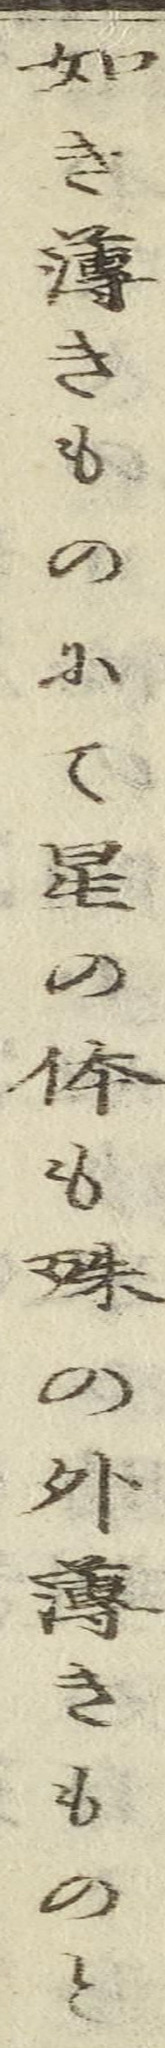如き薄きものにて星の体も殊の外薄きものと
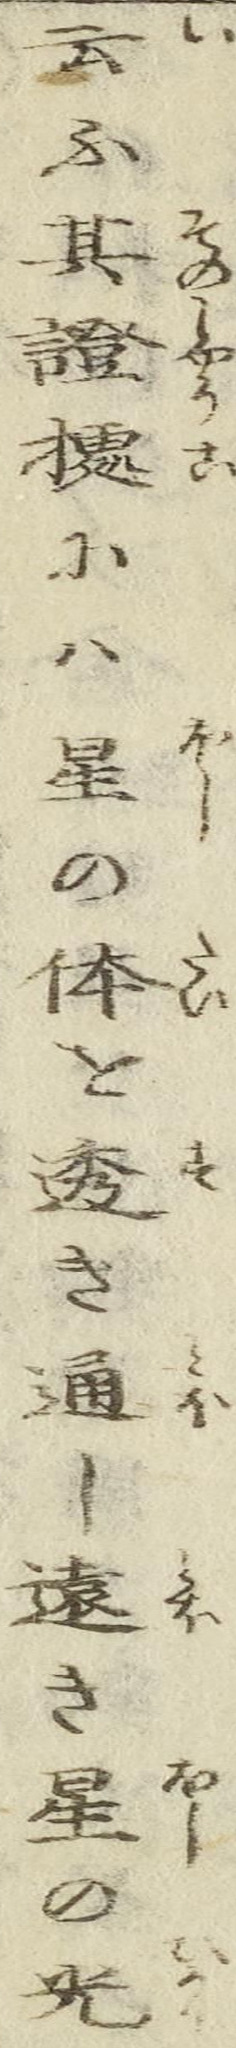云ふ其証拠には星の体を透き通し遠き星の光
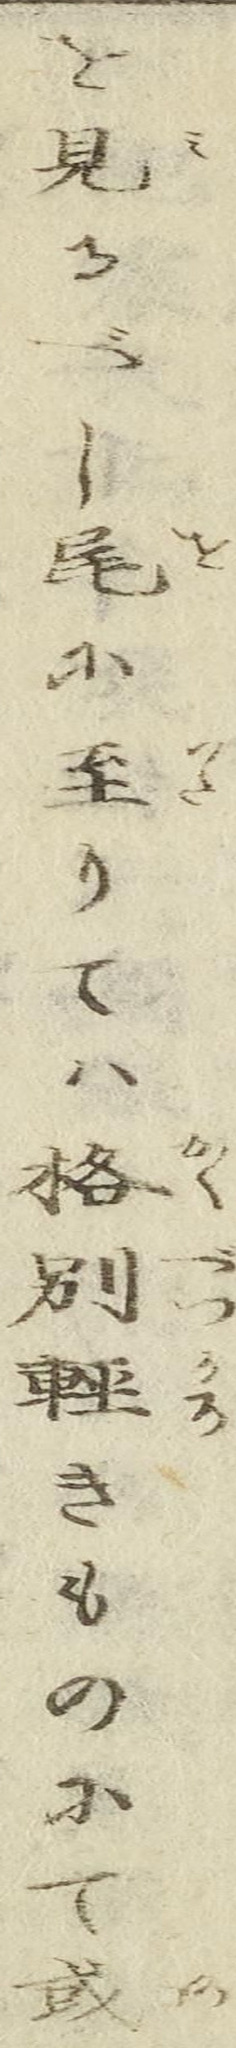を見るべし尾に至りては格別軽きものにて或
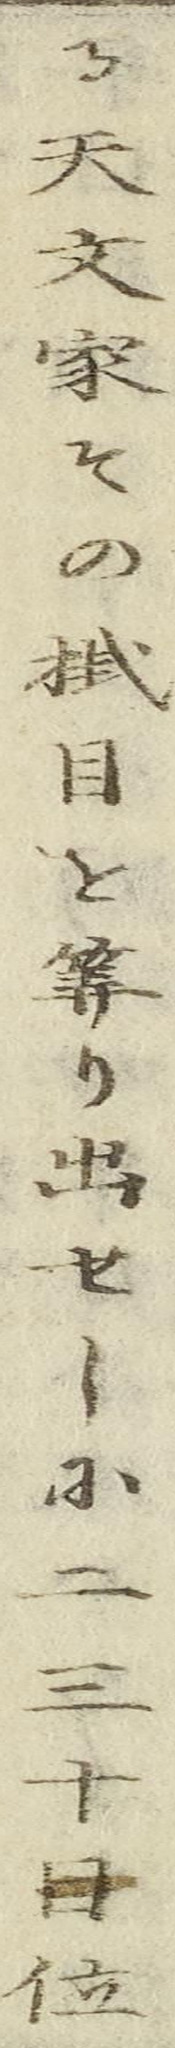る天文家その掛目を算り出せしに二三十目位
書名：天変地異
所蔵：東京大学地震研究所図書室 Earthquake Research Institute Library, The University of Tokyo, JAPAN
